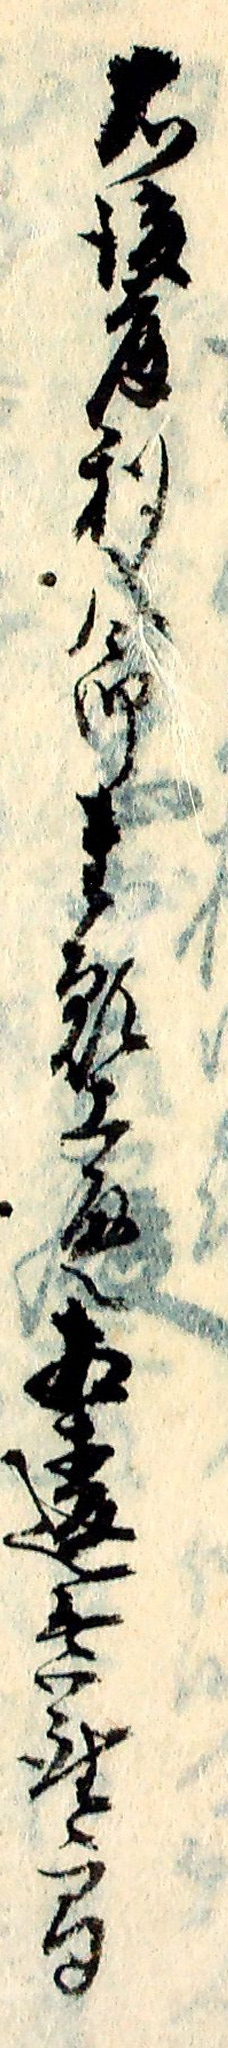右後藤利八郎奉願上通相違無御座候間
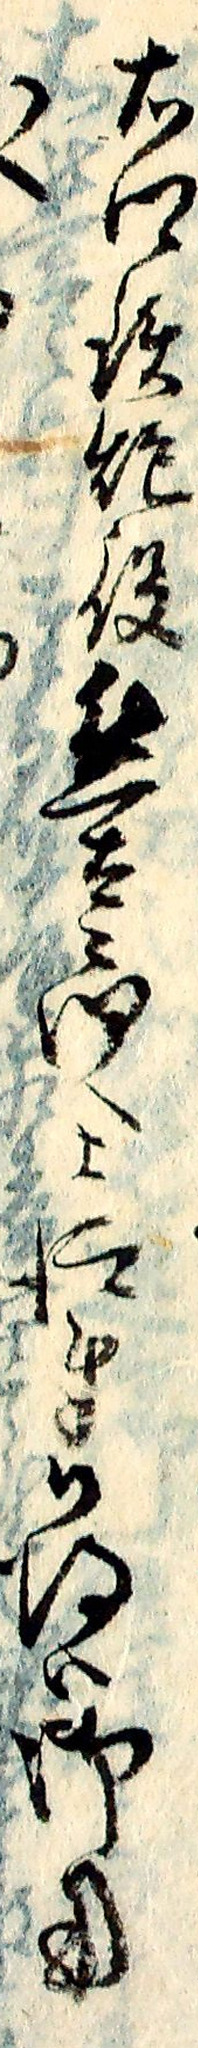右郷鉄炮役熊太郎へ被仰付候得は御用
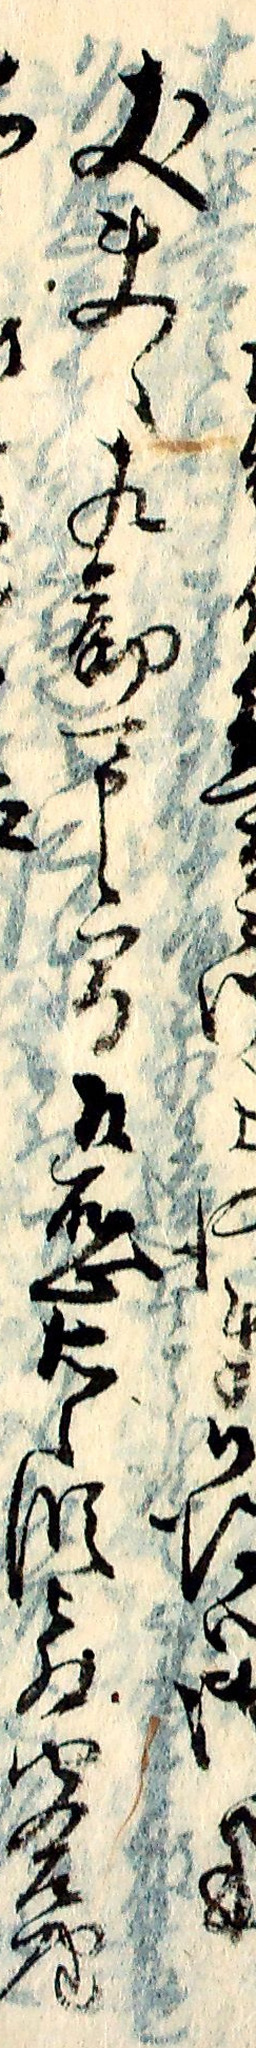丈夫ニ相勤可申候間乍恐右之段被為聞召届
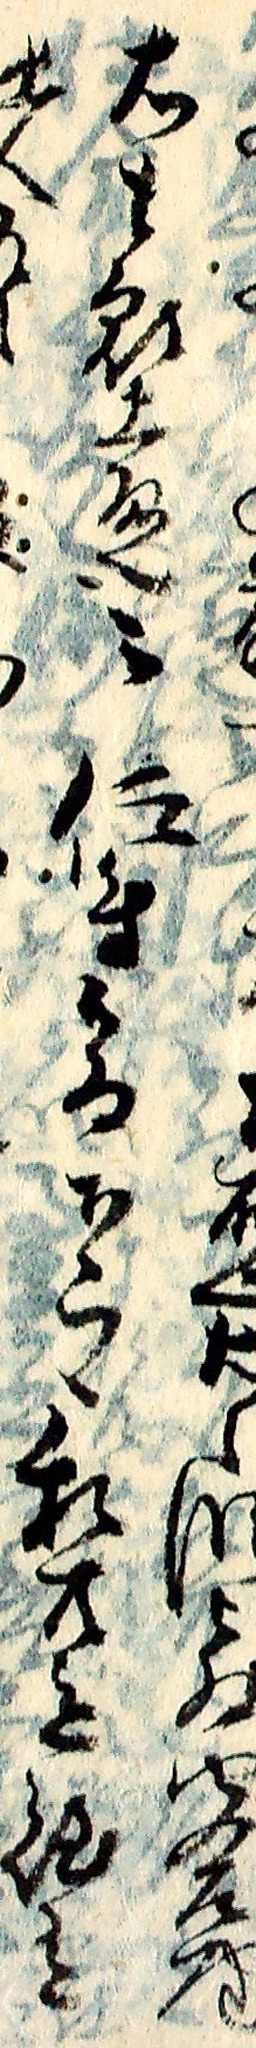右者願上通被仰付被為下候はゝ私共迄難有
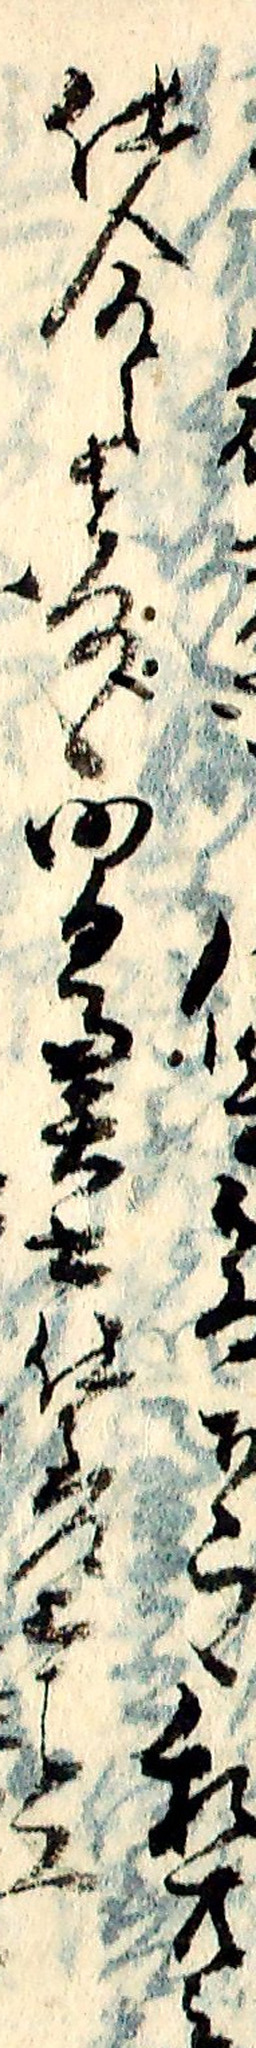仕合に奉存候仍て奥書仕差上申候以上
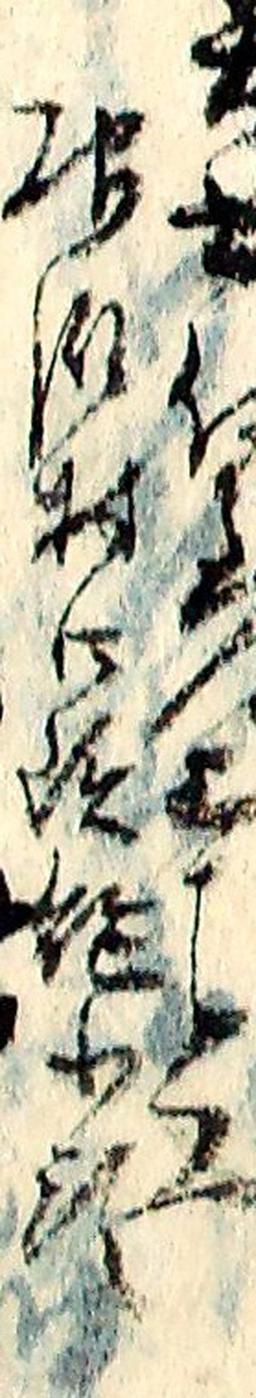神領村郷鉄炮小頭
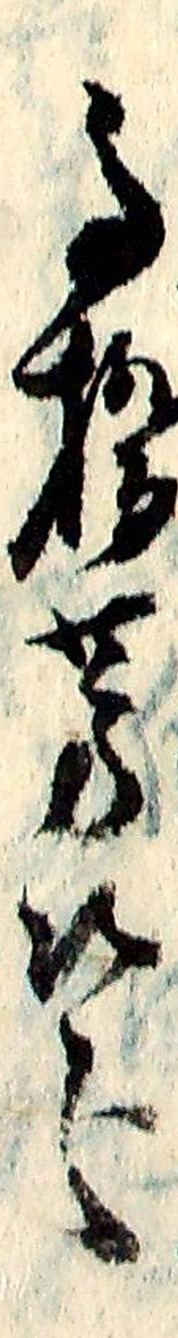高橋芳次郎

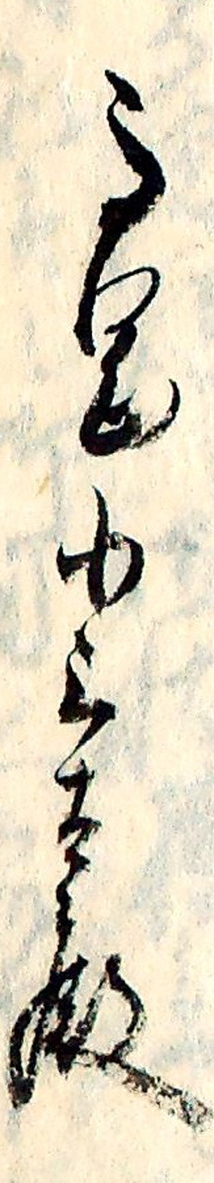高岡小三太殿
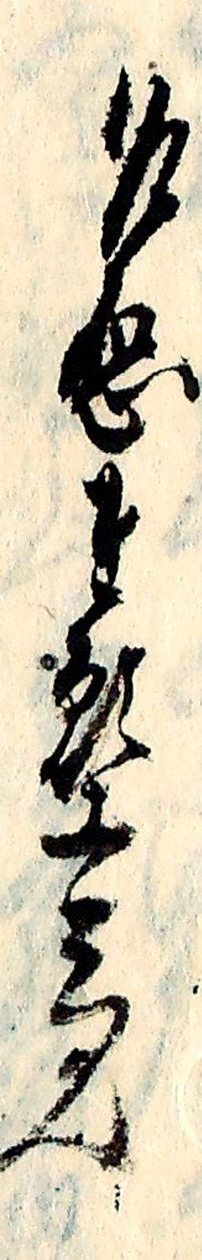乍恐奉願上覚
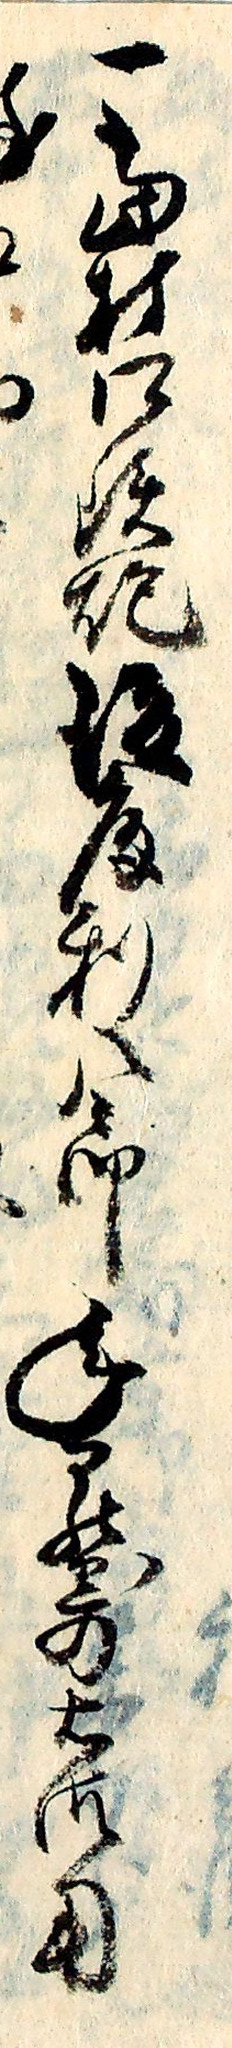一当村郷鉄炮後藤利八郎年罷寄右御用
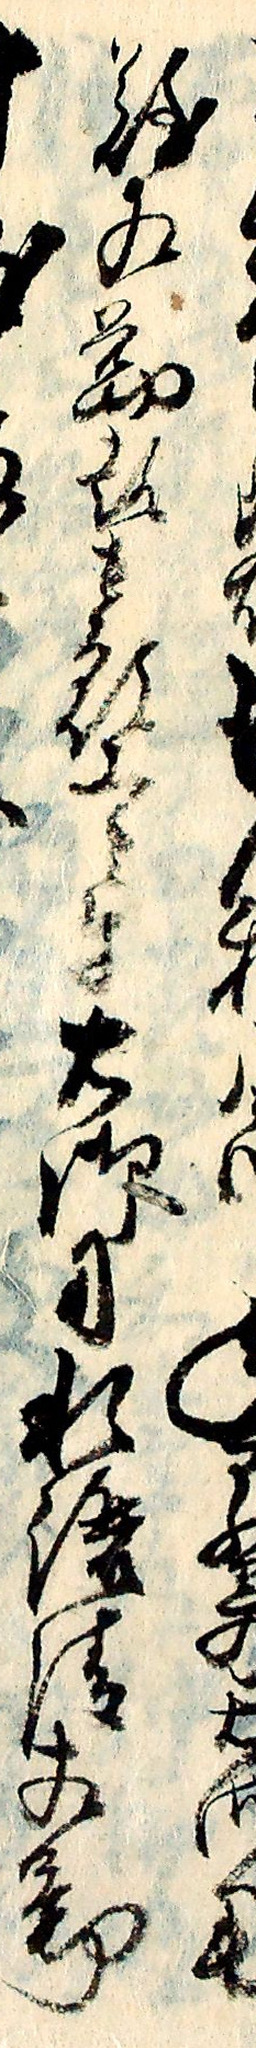難相勤趣奉願上候に付右御用私譲請相勤
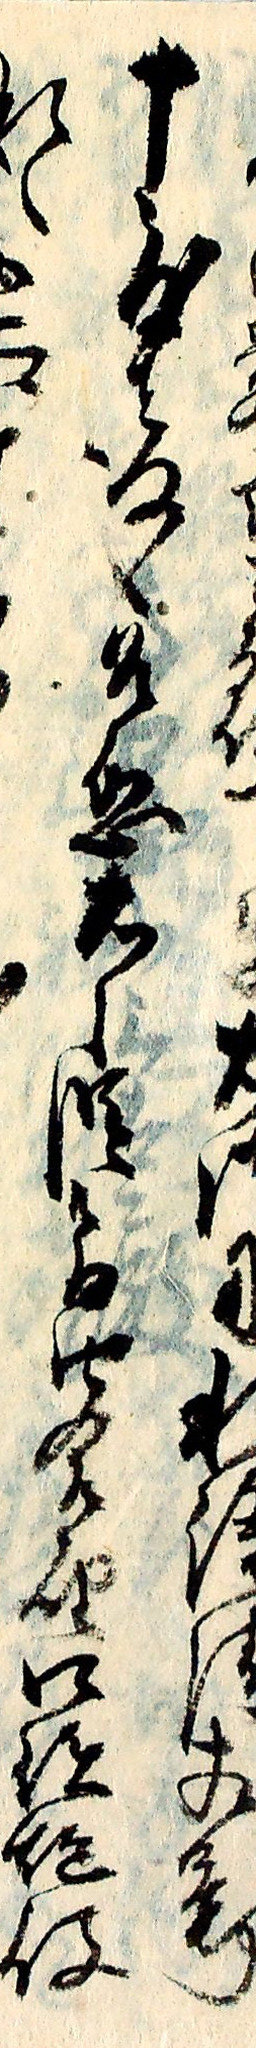申度奉存候乍恐右之段被為聞召届郷鉄炮役
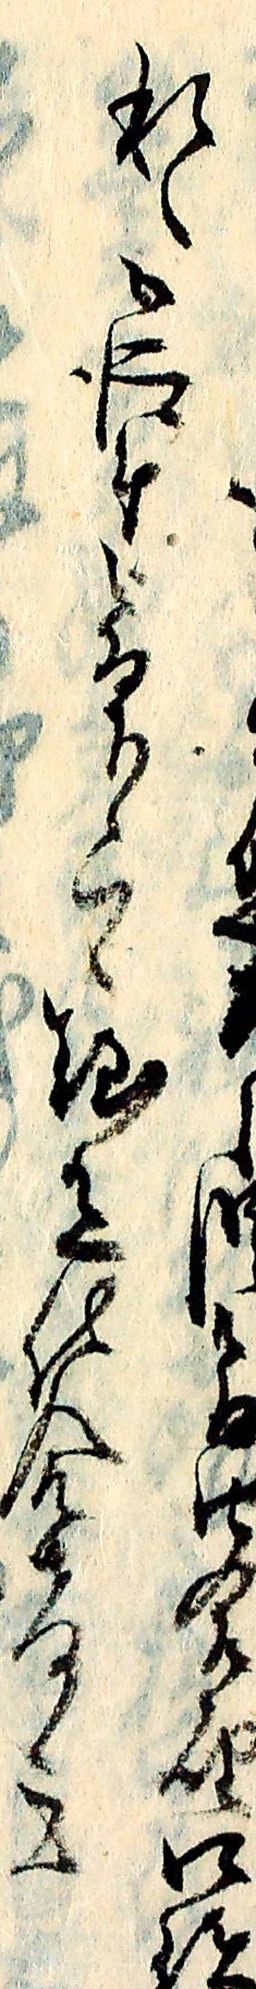私へ被仰付被為下候はゝ難有仕合奉存候以上
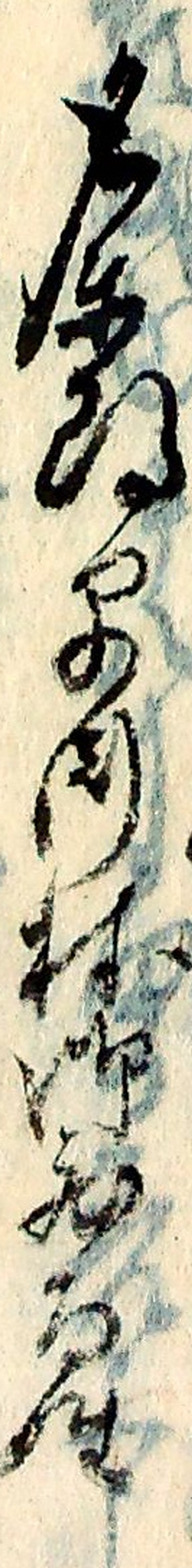名東郡早淵村御蔵百姓
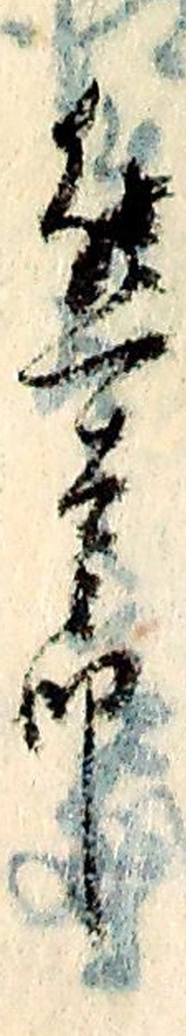熊太郎
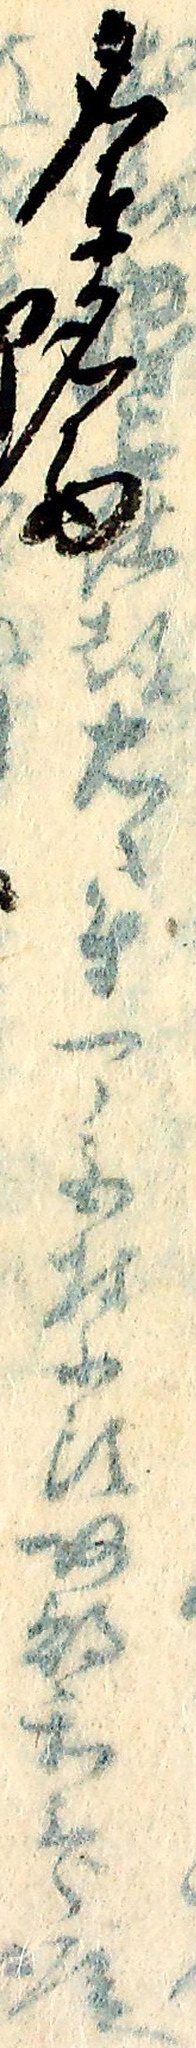名東名西
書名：諸御願書控(後藤氏壱番）
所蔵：鳴門教育大学 Naruto University of Education
